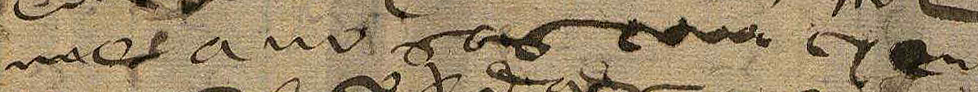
me a nosas comcyem
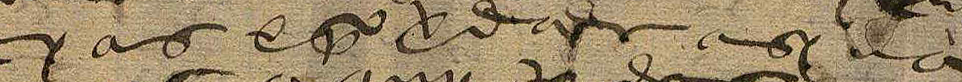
cyas e p̄o ꝟdade asyna
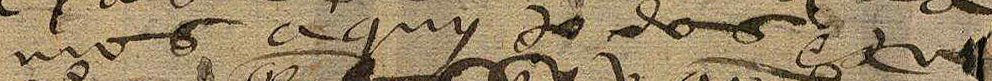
mos aquy todos e Eu
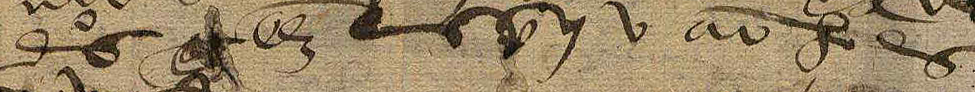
dos gll̄z esp̄yvão ho es
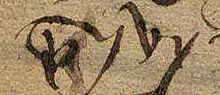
p̄yvy
